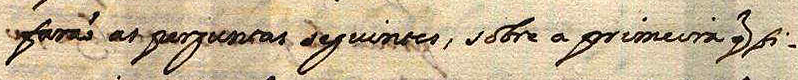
faraõ as perguntas seguintes, sobre a primeira q̄ fi
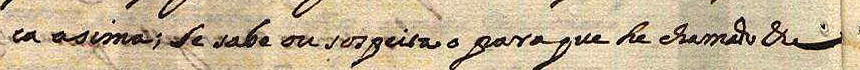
ca asima; se sabe ou sospeita o para que he chamado &a
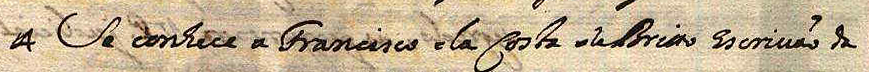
4 Se conhece a Francisco da Costa de Britto Escriuaõ da
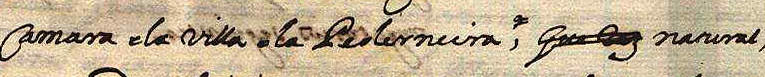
Camara da villa da Pederneira, que Raz natural,
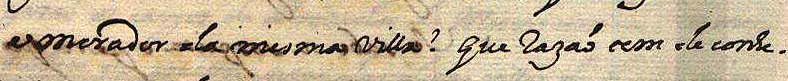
e morador da mesma villa? que Razaõ tem de conhe
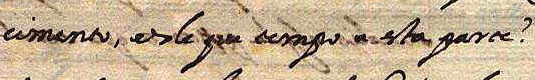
cimento, e de que tempo a esta parte?
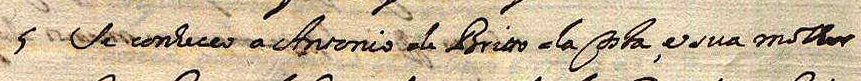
5 Se conheceo a Antonio de Britto da Costa, e sua molher
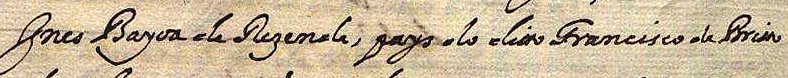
Jnes Bayoa de Rezende, pays do ditto Francisco de Britto
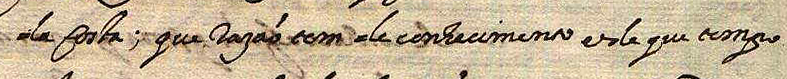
da Costa; que razaõ tem de conhecimento e de que tempo
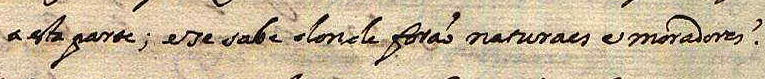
a esta parte; e se sabe donde foraõ naturaes e moradores?
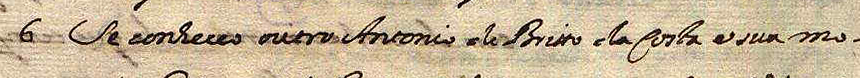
6 Se conheceo outro Antonio de Britto da Costa e sua mo
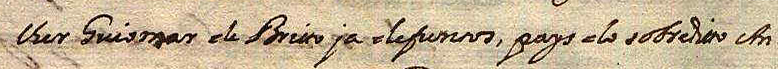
lher Guiomar de Britto ja defuntos, pays do sobreditto An
